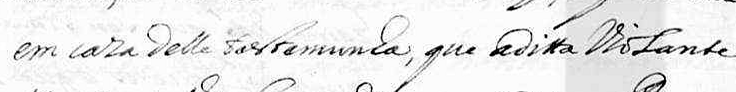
em caza delle testemunha, que a ditta Violante
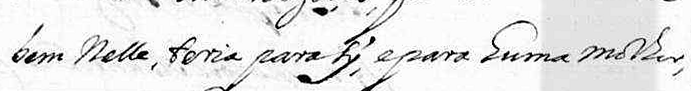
bem nelle, teria para sy, e para huma molher,
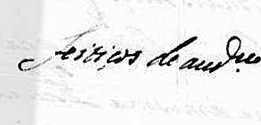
Feitiços de aud.a
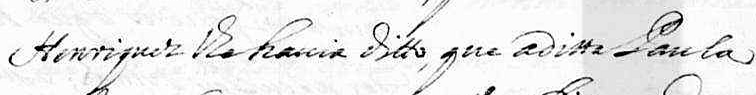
Henriquez lhe hauia ditto, que a ditta Paula
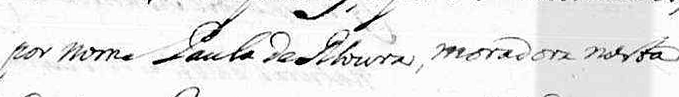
por nome Paula de Moura, moradora nesta
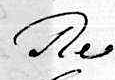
Re
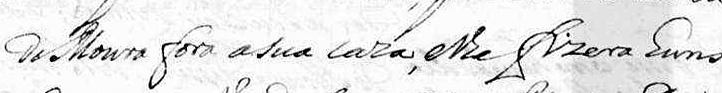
de Moura fora a sua caza, e lhe fizera huns
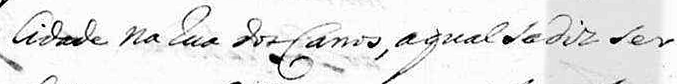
Cidade na Rua dos Canos, a qual se diz ser
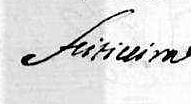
feiticeira
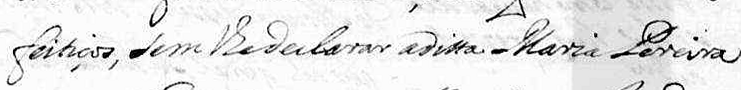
feitiços, sem lhe declarar a ditta Maria Pereira
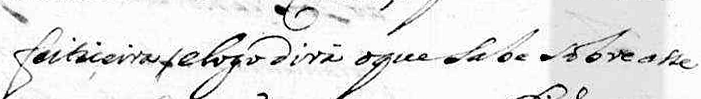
feiticeira / e logo dirá o que sabe sobre esse
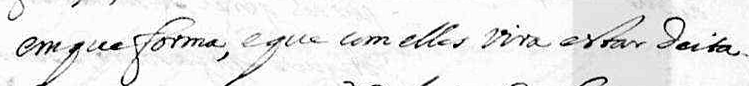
em que forma, e que com elles vira estar deita
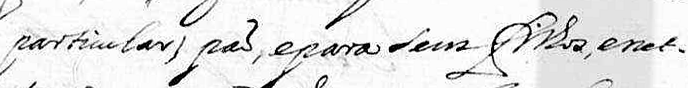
particular, paõ, e para seus filhos, e net
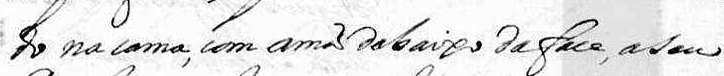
do na cama, com a maõ dabaixo da face, a seu
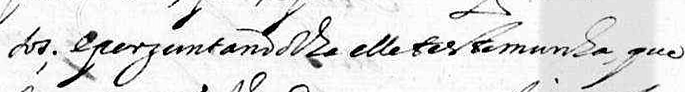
tos; e perguntandolhe elle testemunha, que
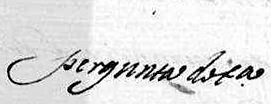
pergunta do t.a
